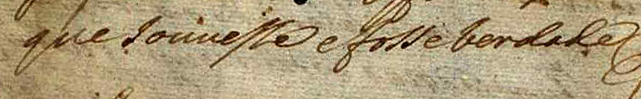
que souuesse e fosse verdade
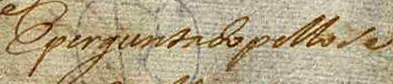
E perguntado pello se
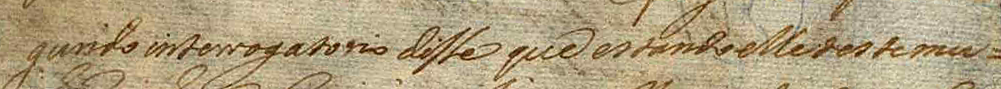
gundo interrogatorio disse que estando elle testemu
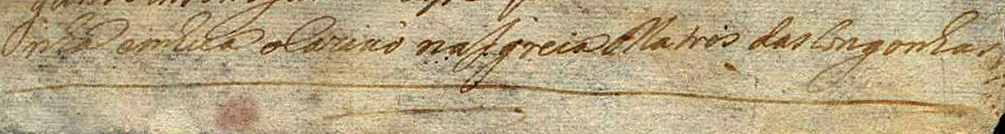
nha em hua oCaziaõ na Jgreia Matris das Congonhas
